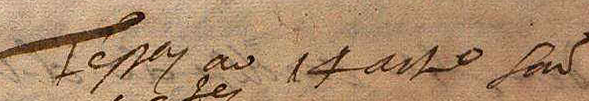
Testas ao 14 arto saõ
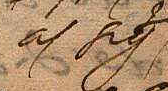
as segtes
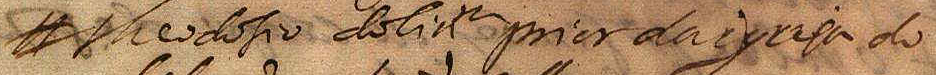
item theodosio doliura prior da igreja do
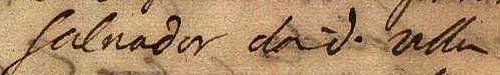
saluador da d. villa
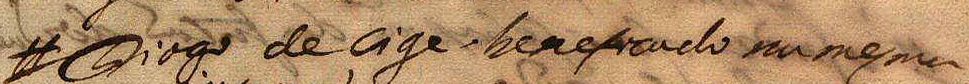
item Diogo de cige beneficado na mesma
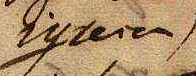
igreia /
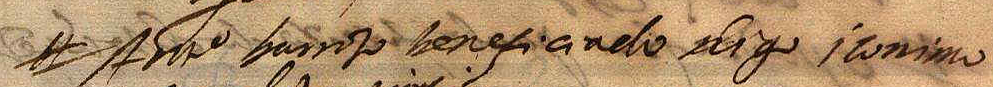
item Anto barrozo beneficiado digo iconimo
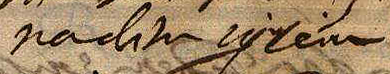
na dita igreia
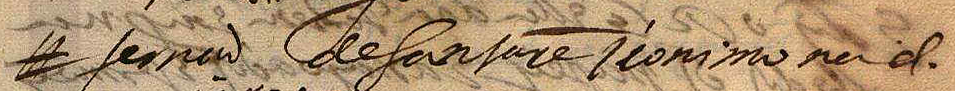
item fernaõ de santarē iconimo na d.
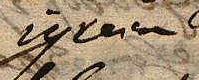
igreia
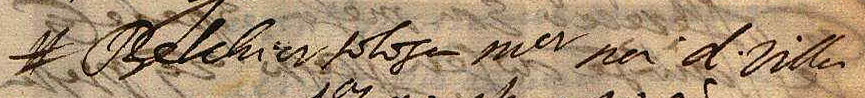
item Belchior tolosa mor na d. villa
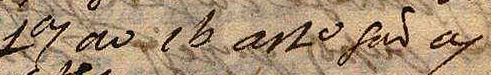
tas ao 1b arto saõ as
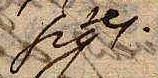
segtes.
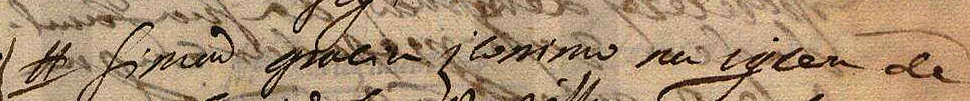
item Simaõ gracia jconimo na igreia de
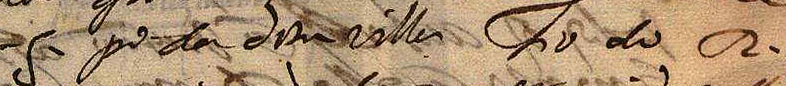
s. po da dita villa tio do R.
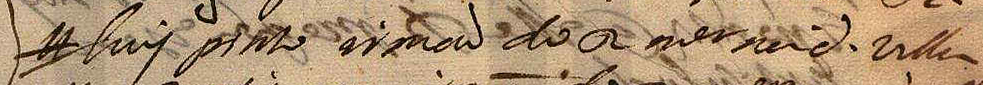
item luis pinto irmaõ do R mor na d. villa
